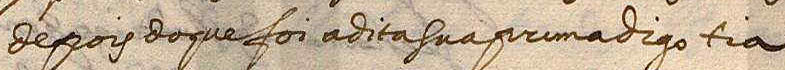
depois do que foi a dita sua prima digo tia
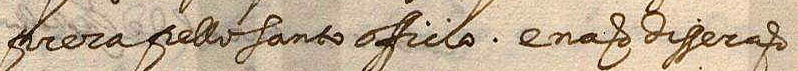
preza pello santo officio. e naõ disseraõ
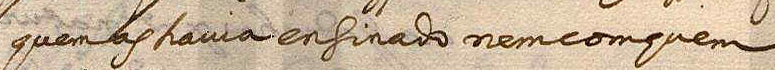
quem as hauia ensinado nem com quem
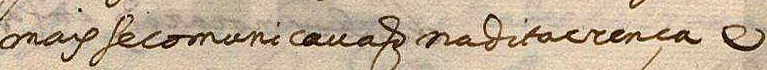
mais se comunicauaõ na dita crença e
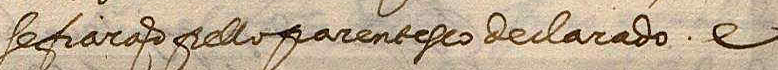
se fiaraõ pello parentesco declarado. e
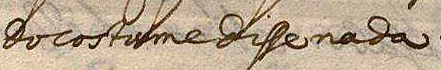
do costume disse nada.
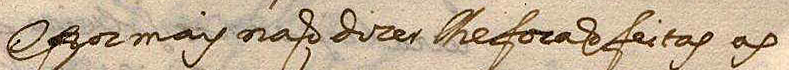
E por mais não dizer lhe foraõ feitas as
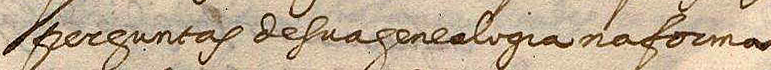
perguntas de sua genealogia na forma
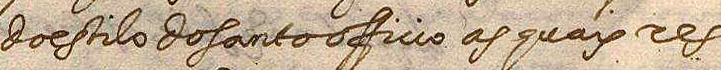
do estilo do santo officio as quais res
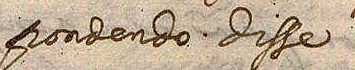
pondendo. disse
